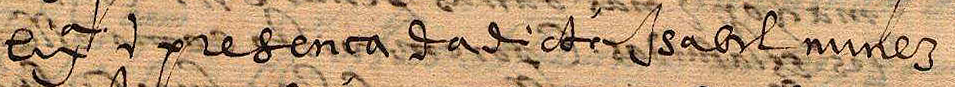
ē lixa ē presença da dicta Jsabel nunez
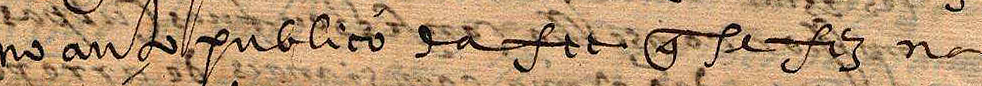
no auto publico da fee q̄ se fez na
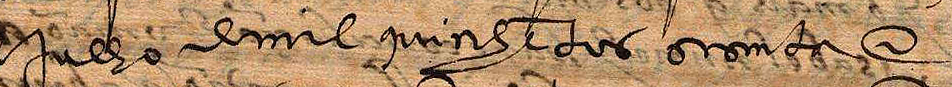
de Julho de mil quinhētos sesenta e
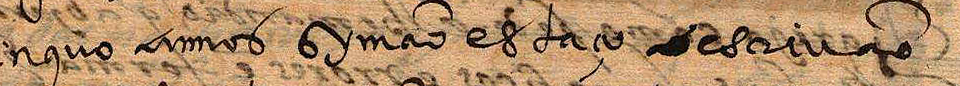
cinquo annos symaõ estaço o escriuaõ
